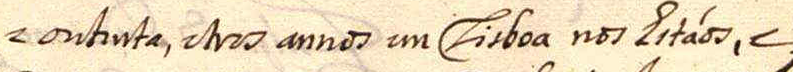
e outenta, e tres annos em Lisboa nos Estáos, e
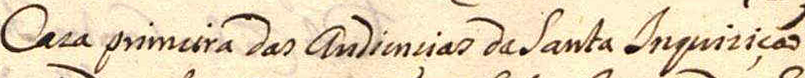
Caza primeira das Audiencias da Santa Jnquizição
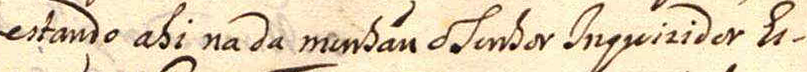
estando ahi na da menha̅n o Senhor Inquizidor Es
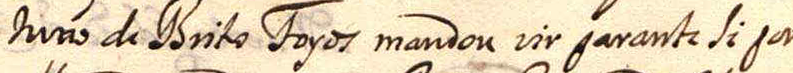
tevão de Brito Foyos mandou vir parante si por
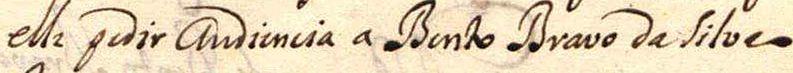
elle pedir Audiencia a Bento Bravo da Silva
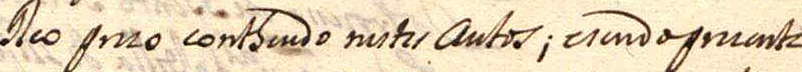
Reo prezo contheudo nestes Autos; e sendo prezente
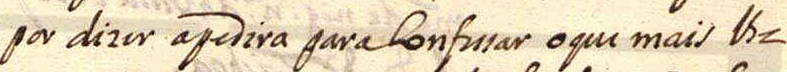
por dizer a pedira para Confessar o que mais lhe
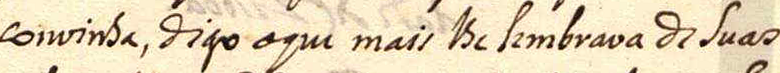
convinha, digo o que mais lhe lembrava de suas
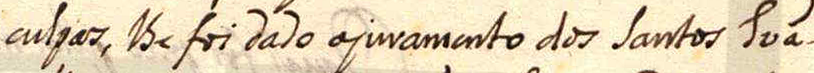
culpas, lhe foi dado o juramento dos Santos Eva̅
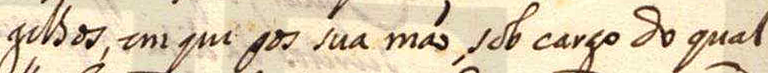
gelhos, em que pos sua mão, sob cargo do qual
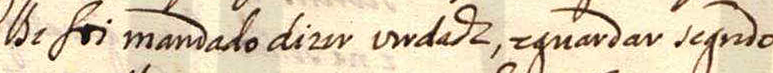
lhe foi mandado dizer verdade, e guardar segredo
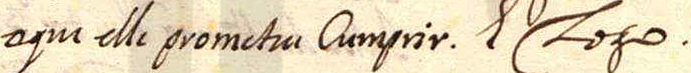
o que elle prometeu Cumprir. E Logo.
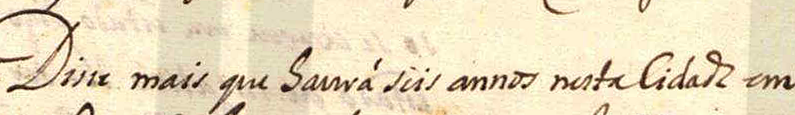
Disse mais que haverá seis annos nesta Cidade em
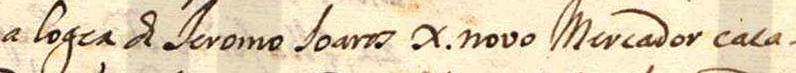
a logea de Jeromo Soares X. novo Mercador caza
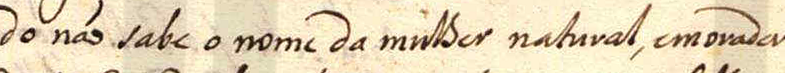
do não sabe o nome da mulher natural, e morador
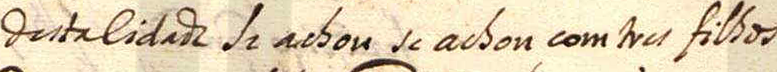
desta Cidade se achou se achou com tres filhos
